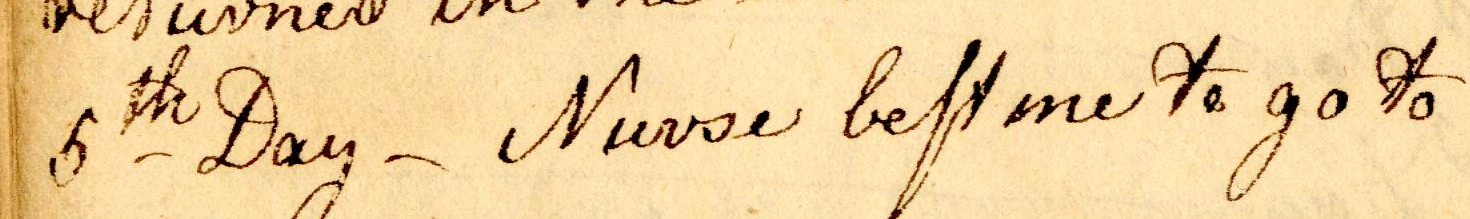5^th- Day- Nurse left me to go to
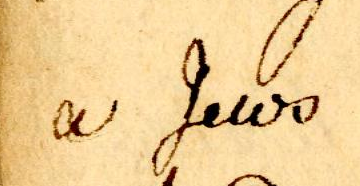a Jews
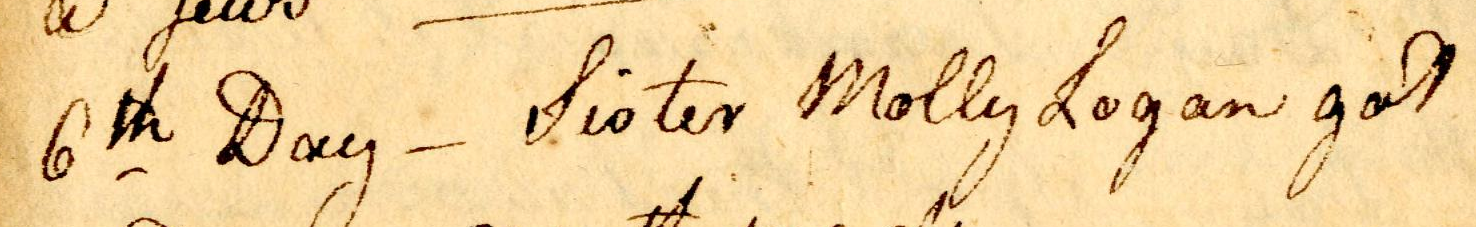6^th Day- Sister Molly Logan got
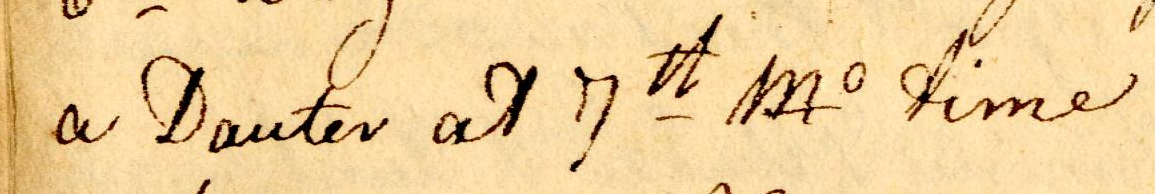a Dauter at 7^th M^o time
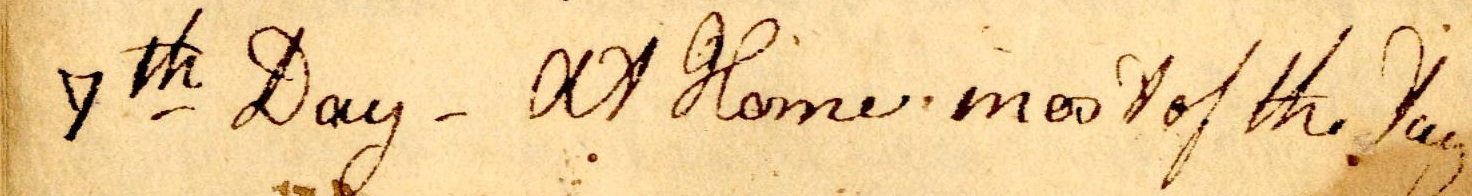7^th Day- at Home most of the day
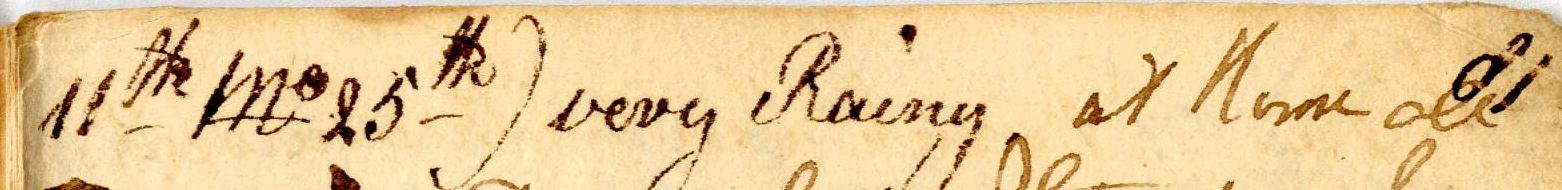11^th M^o 25^th) very Rainy at Home all
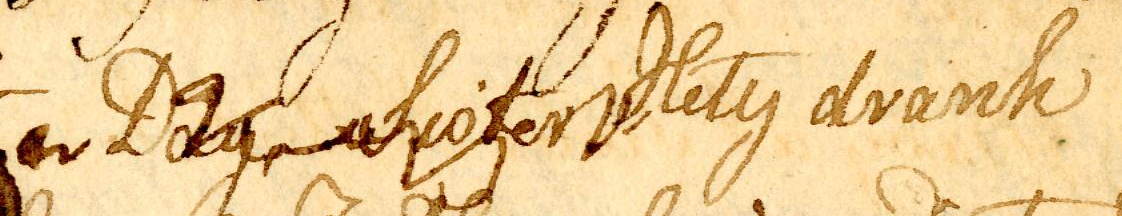Day Sister Hetty drank
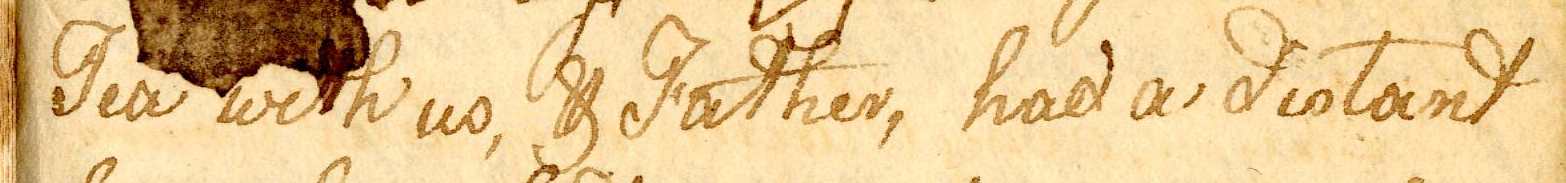Tea with us & Father, had a distant
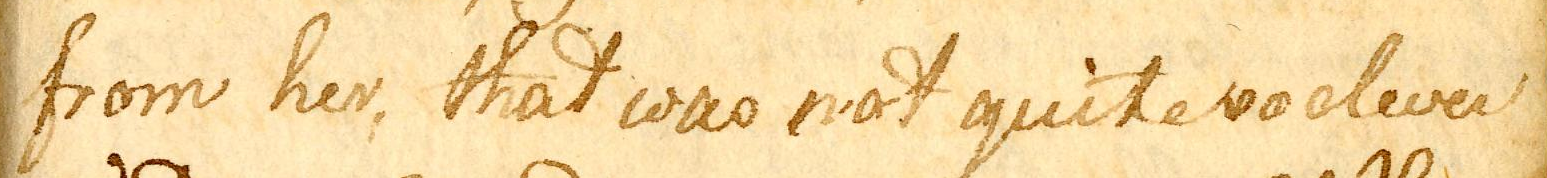from her, that was not quite so clever
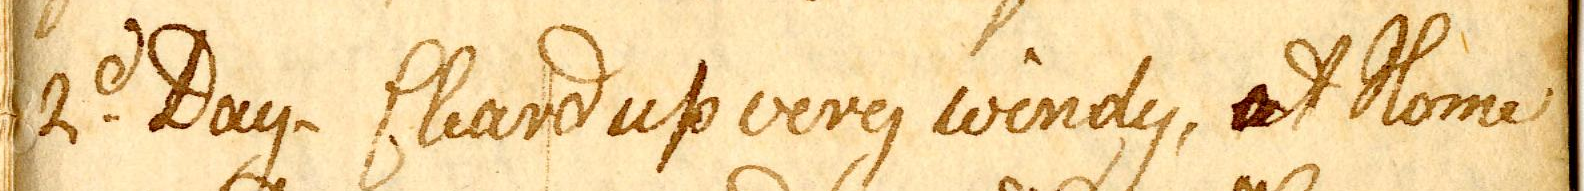2^d. Day- Cleard up very windy, at Home
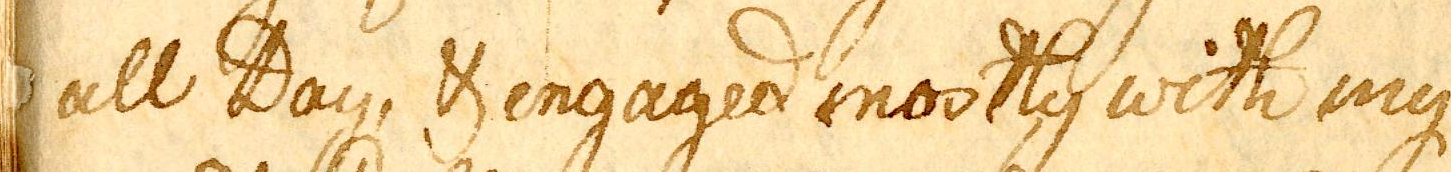all Day, & engaged mostly with my
